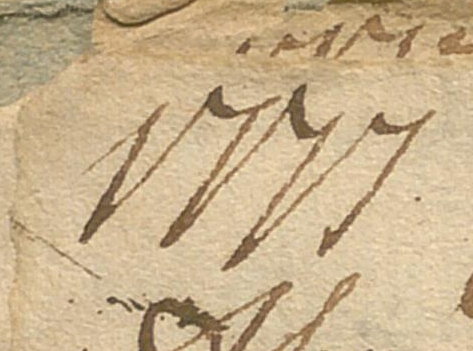1777
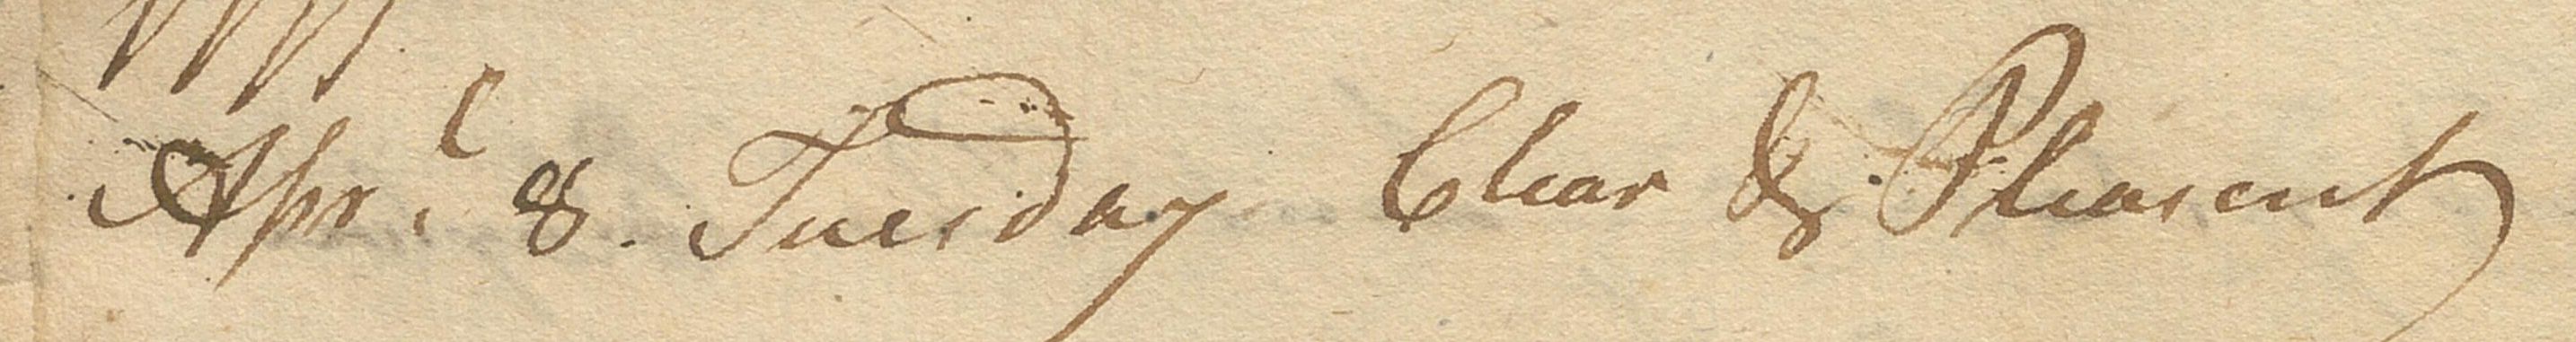Apr^l. 8. Tuesday Clear & Pleasent
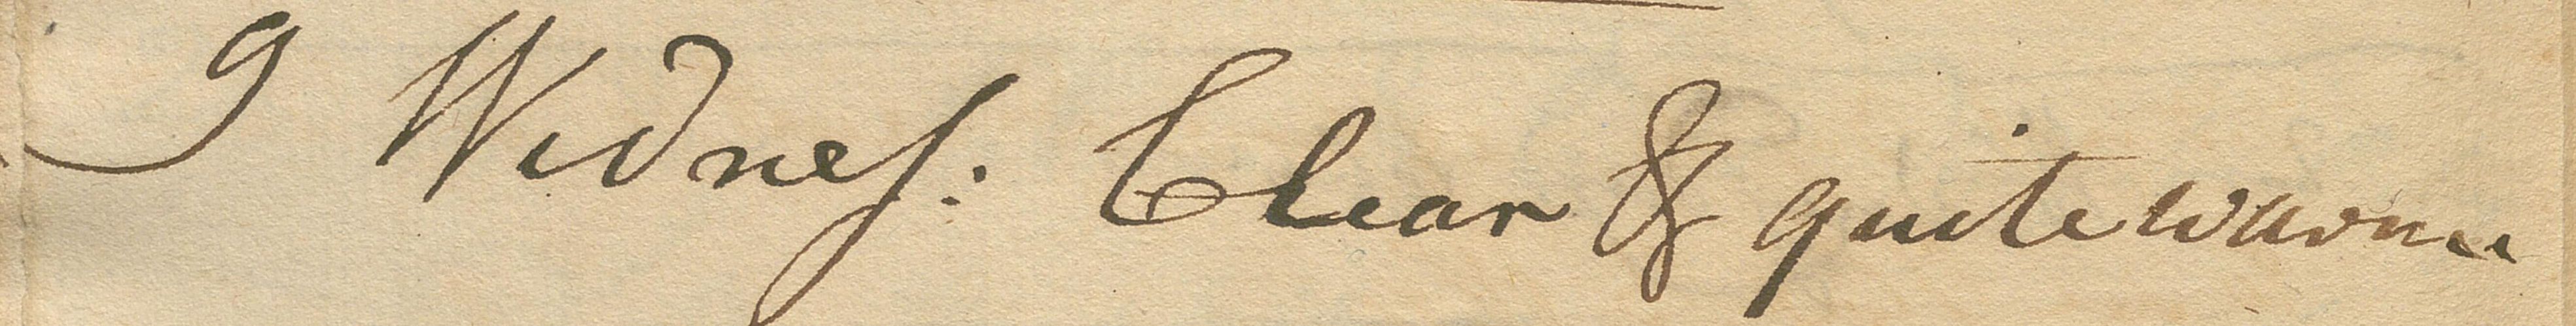9 Wednes: Clear & quite warme
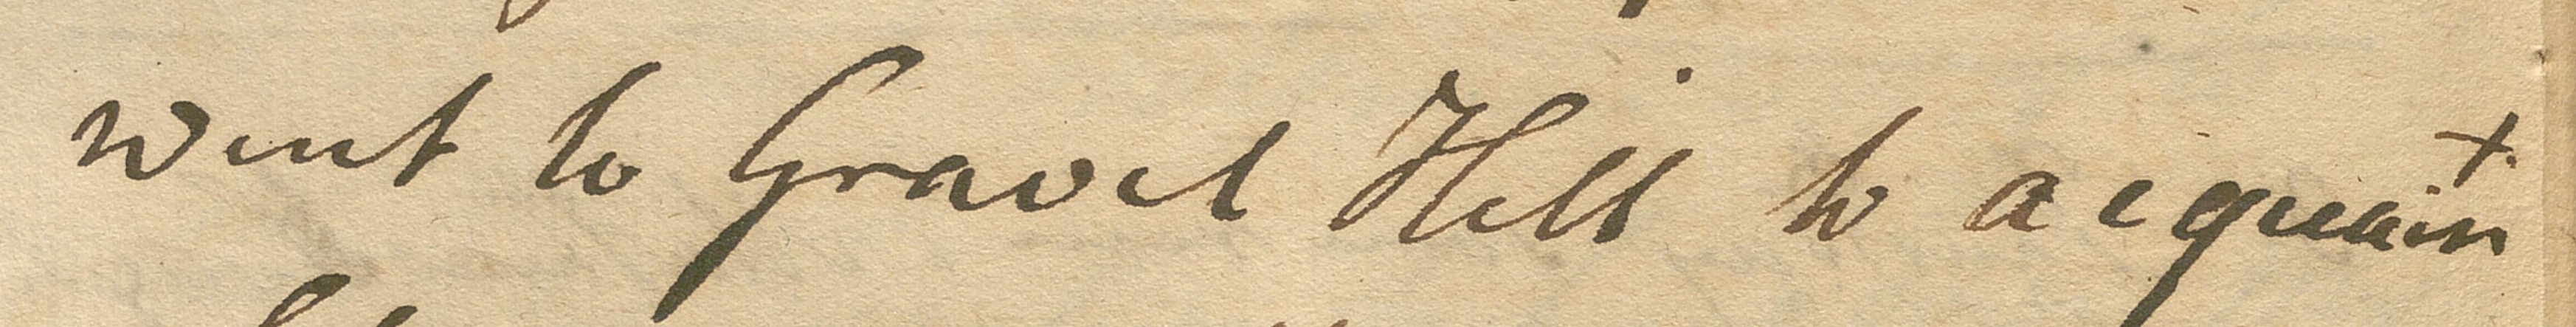went to Gravel Hill to a acquain^t
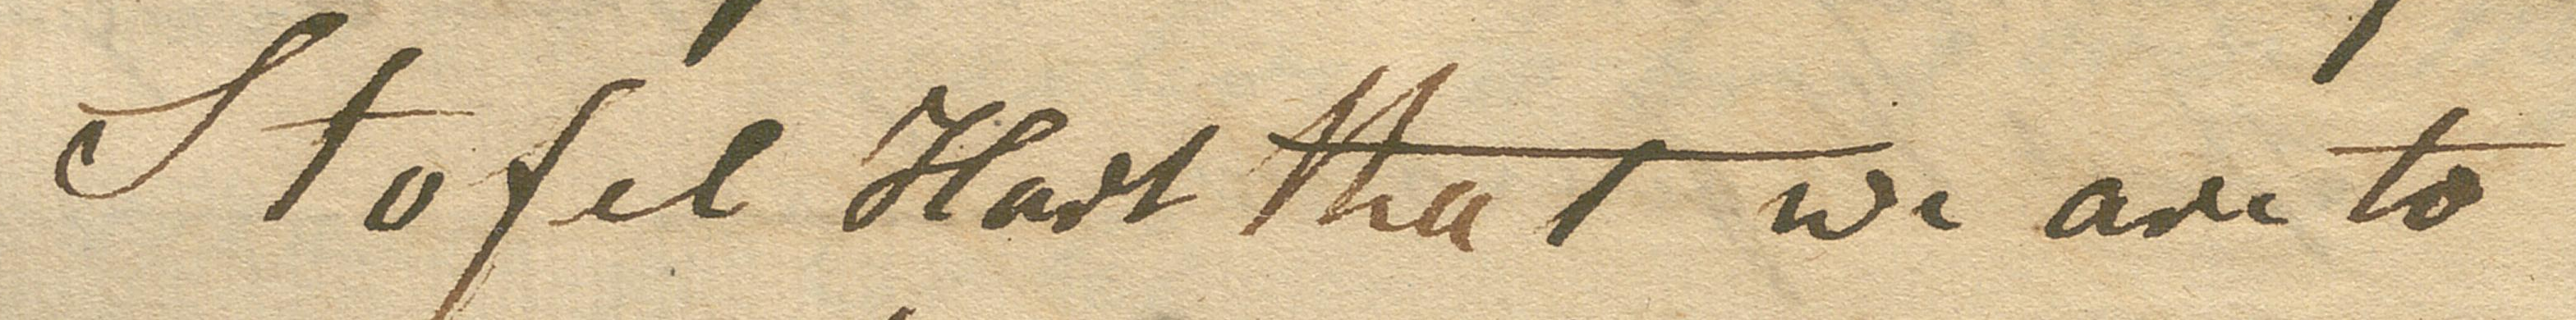Stofel Hart that we are to
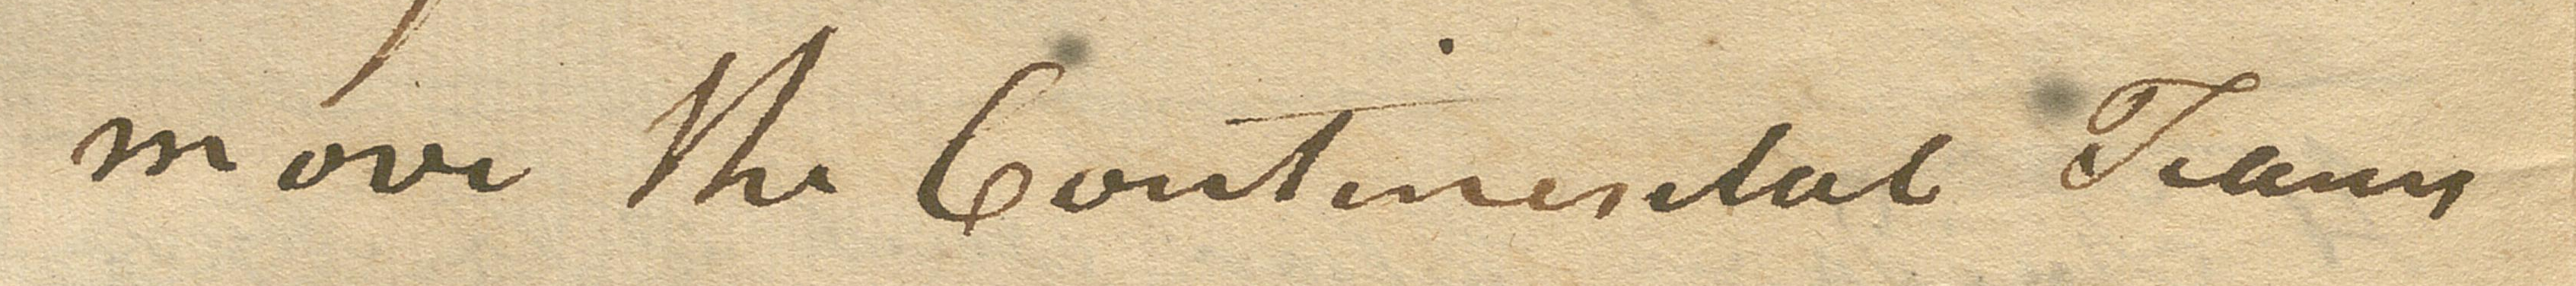move the Continental Teams
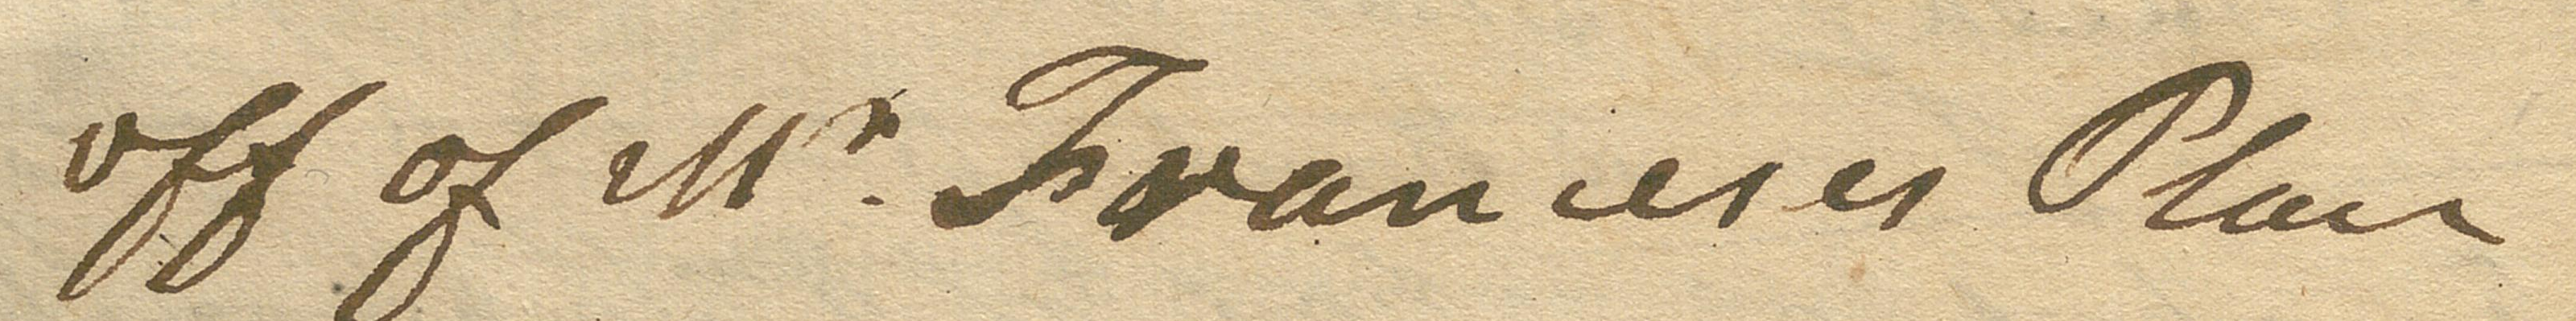off of M^r. Franceses Place
